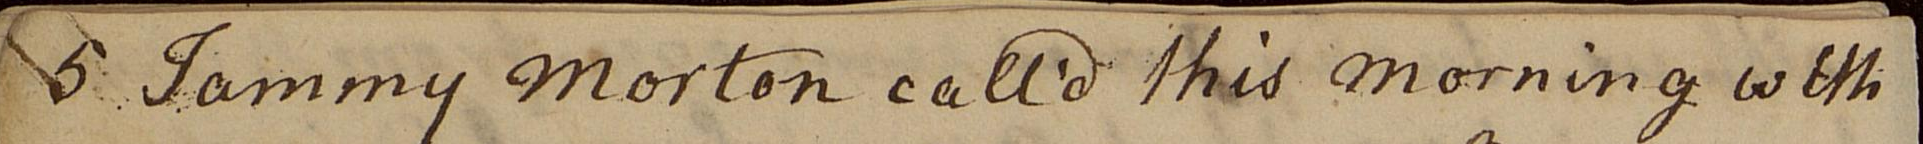5 Sammy Morton call'd this Morning with
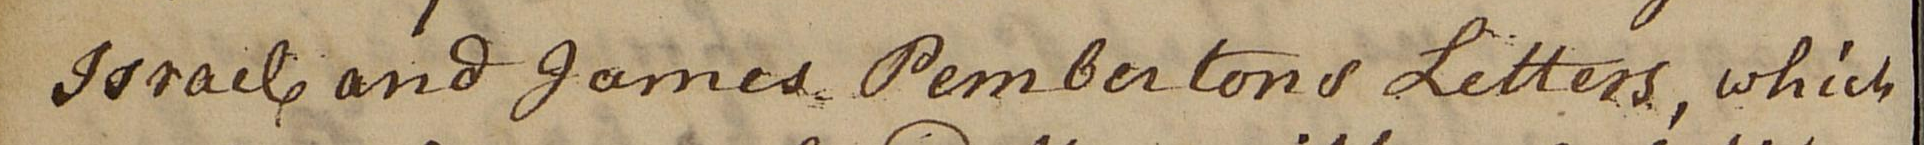Israel and James Pembertons Letters, which
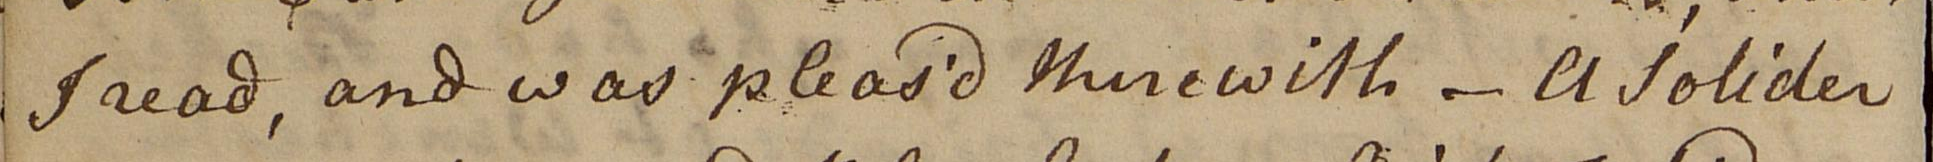I read and was pleas'd therewith- A Solider
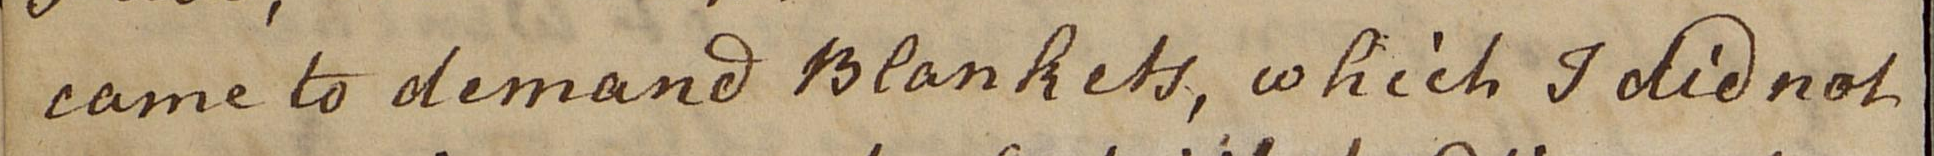came to demand Blankets, which I did not
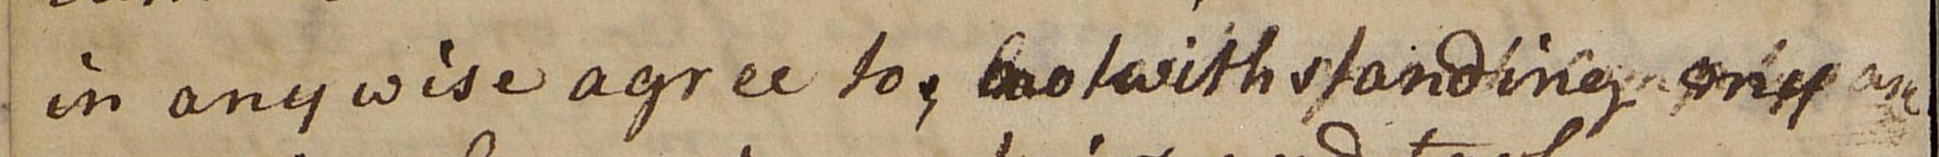in any wise agree to, notwithstanding my
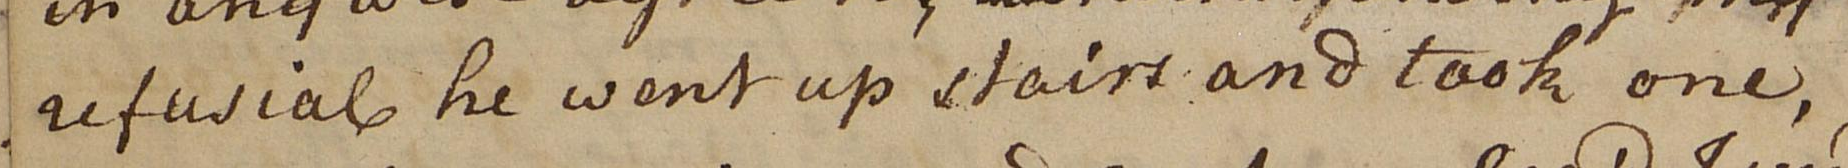refusial he went up stairs and took one,
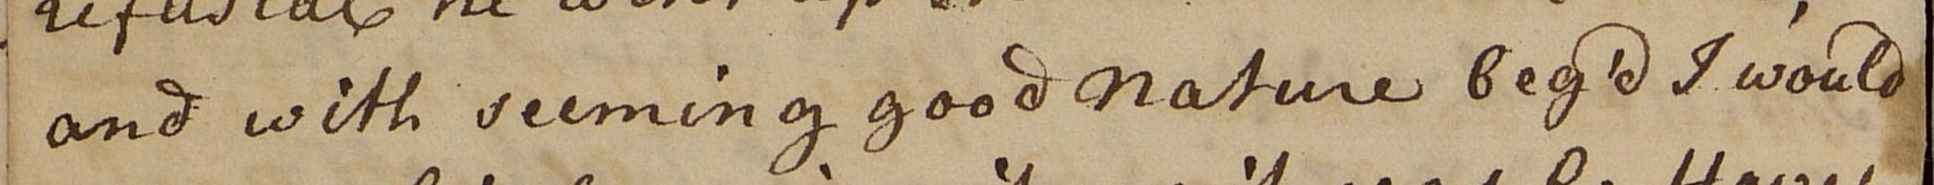and with seeming good Nature beg'd I would
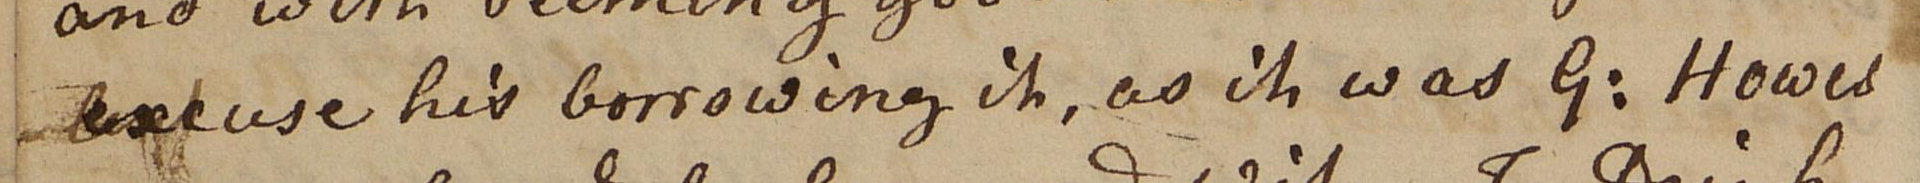excuse his borrowing it, as it was G: Howes
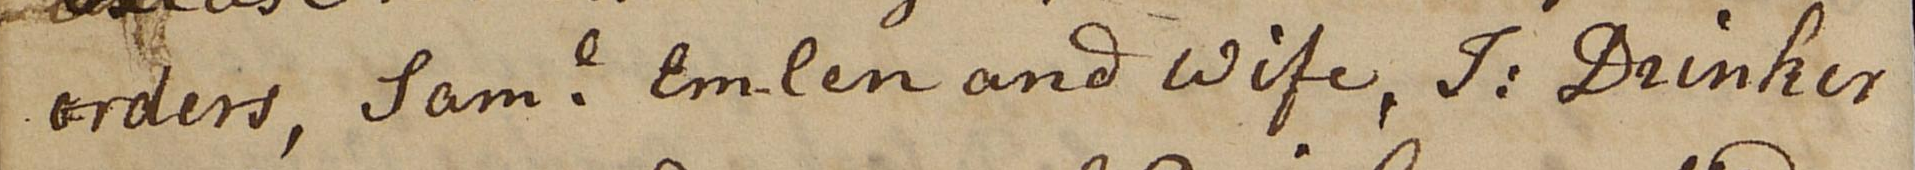orders, Sam^l. Emlen and Wife, S: Drinker
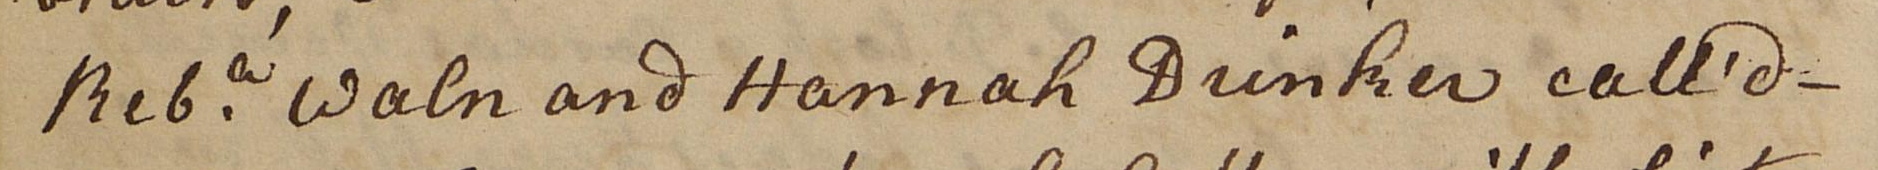Reb^a. Waln and Hannah Drinker call'd-
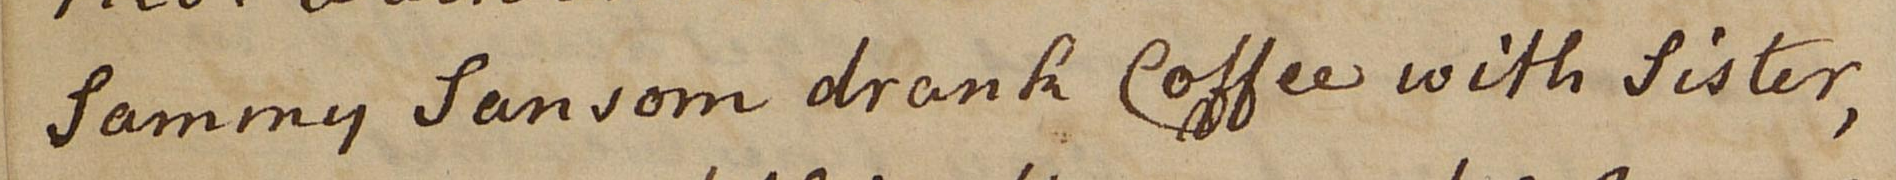Sammy Sansom drank Coffee with Sister,
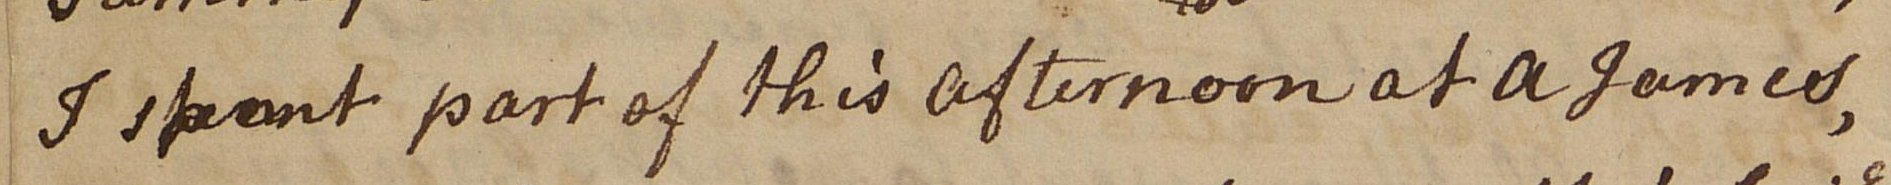I spent part of this Afternoon at A James,
